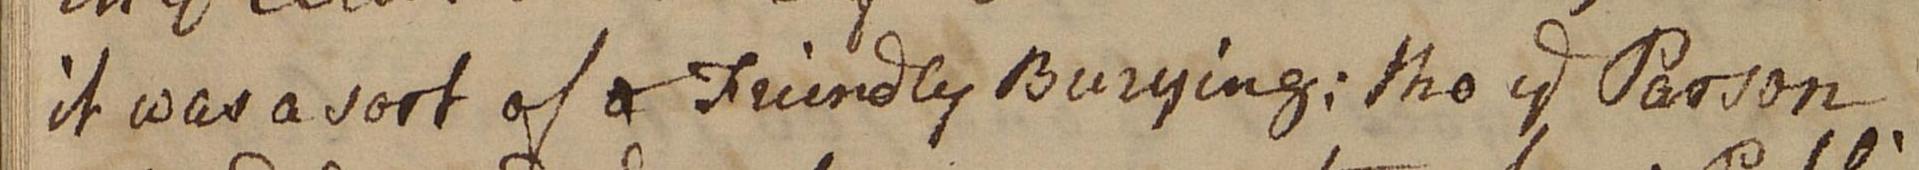it was a sort of a Friendly Burying: tho y^e Parson
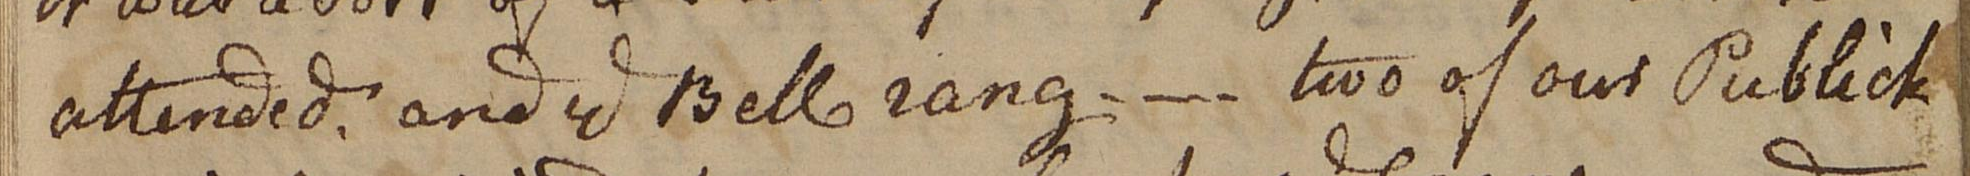attended and y^e Bell rang-- two of our Publick
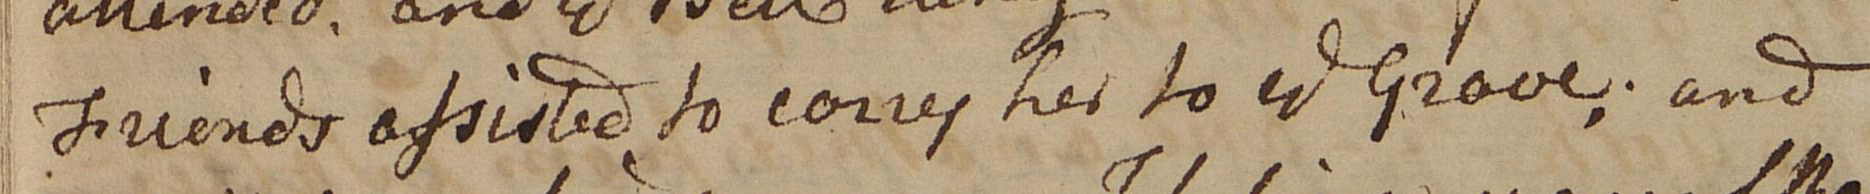Friends assisted to coney her to y^e Grave and
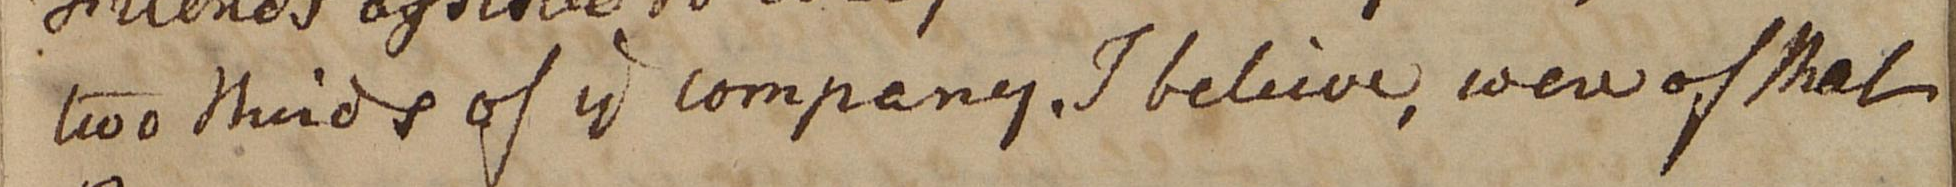two thirds of y^e company, I believe were of that
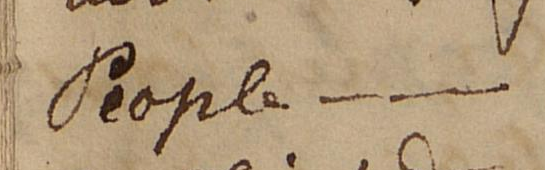People.-
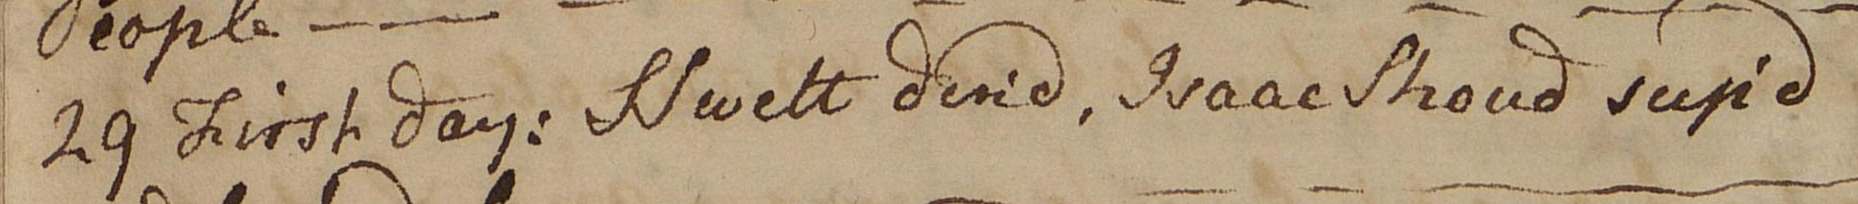29 First day. S Swett dind, Isaac Shoud sup'd
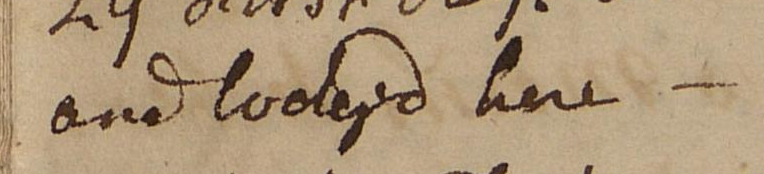and lodg'd here-
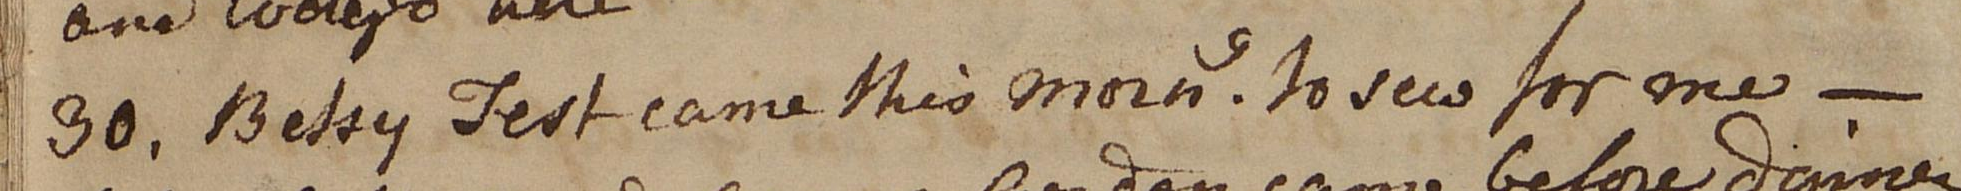30 Betsy Test came this morn^g. to sew for me-
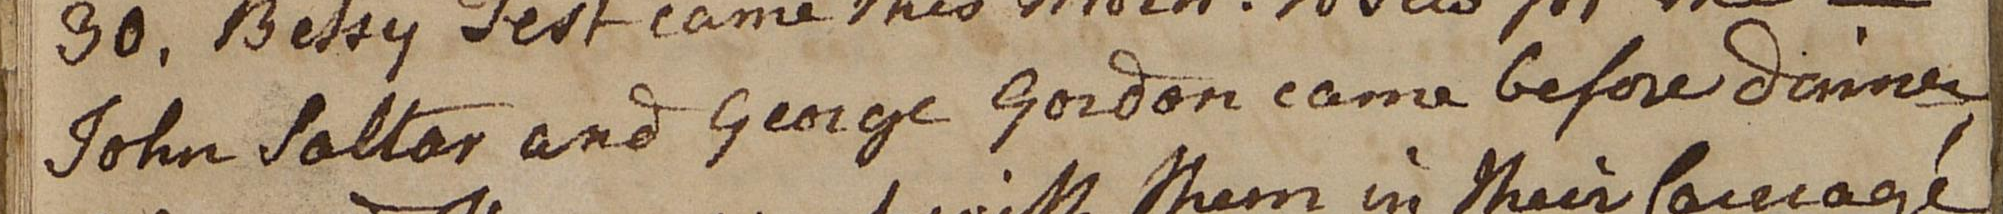John Saltar and George Gordon came before dinner,
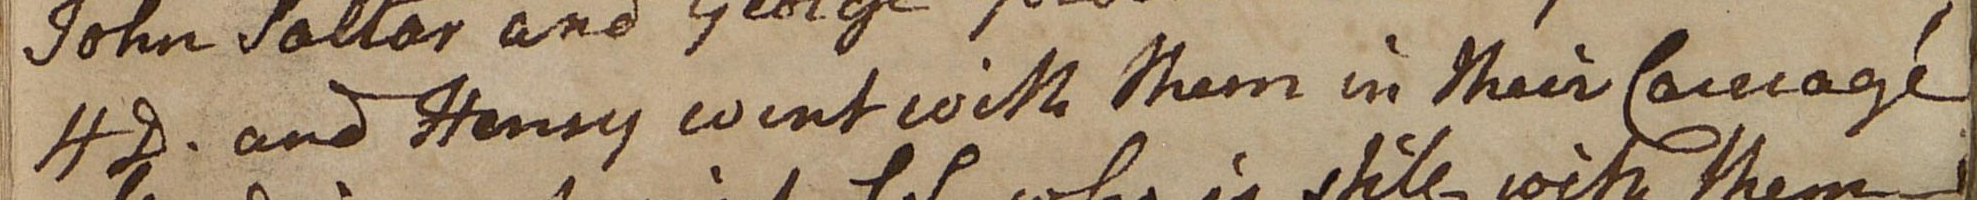HD and Henry went with them in their Carriage
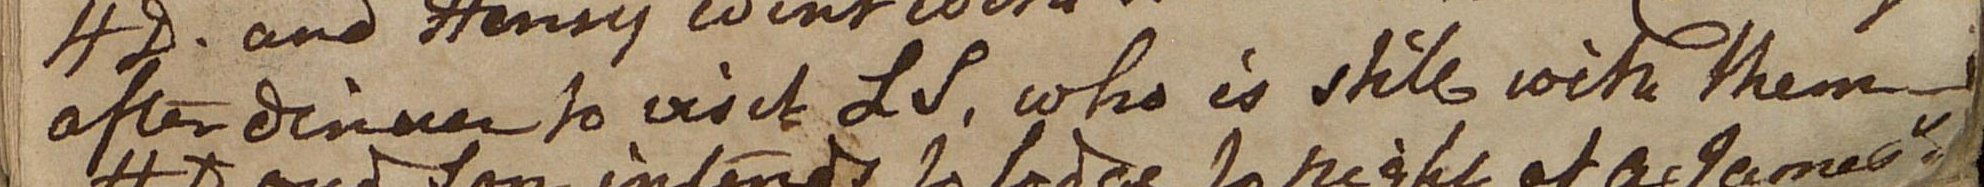after dinner visit LS. who is still with them-
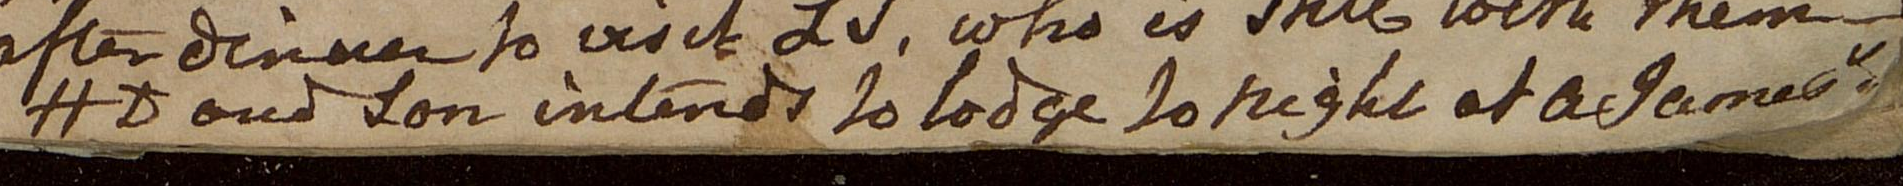HD and son intends to lodge tonight at A James^s.
